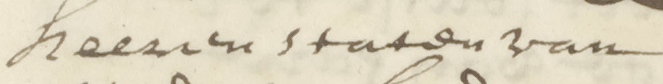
heeren staten van
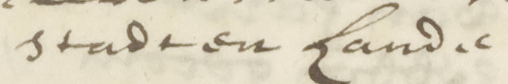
stadt en Lande
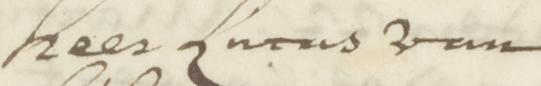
heer Lucas van
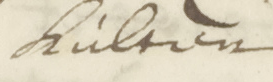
hulten
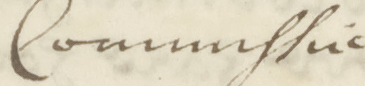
Commissie
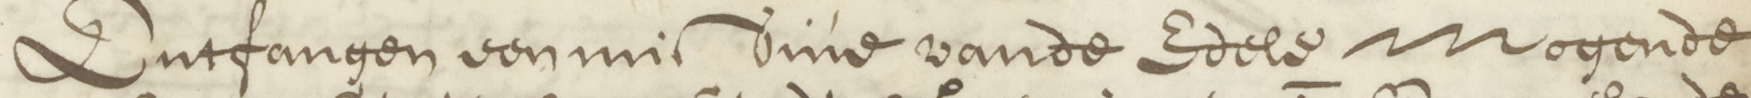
Ontfangen een missiue vande Edele Mogende
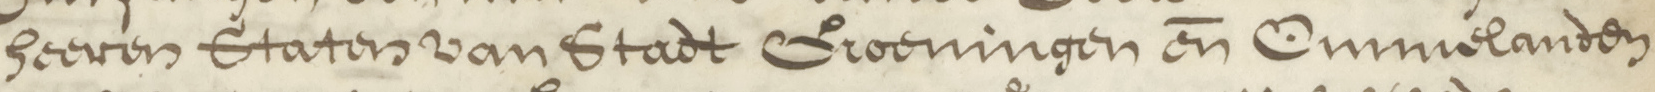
heeren Staten van Stadt Groeningen en Ommelanden
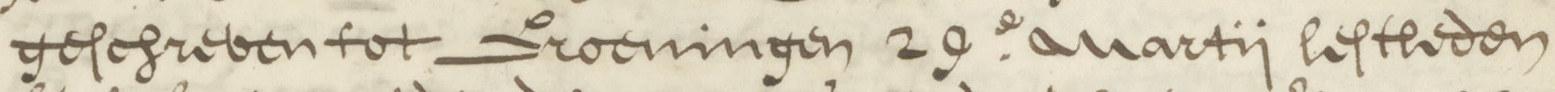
geschreven tot Groeningen 29e. Martij lestleden
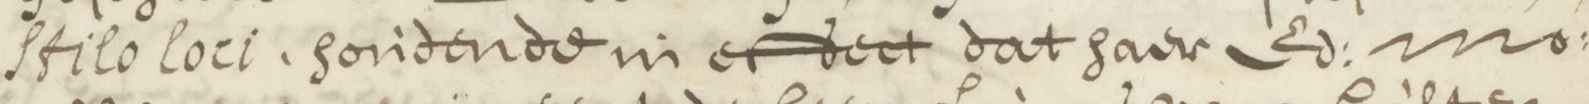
stilo loci, houdende in effect dat haer Ed:Mo:
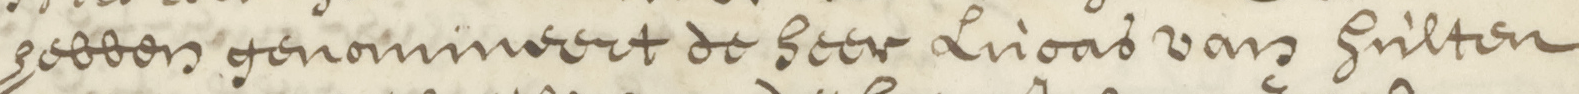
hebben genomineert de heer Lucas van hulten
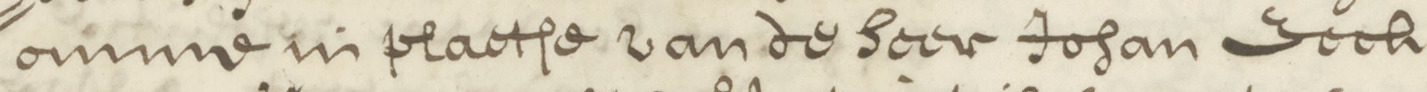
omme in plaetse van de heer Johan Eeck
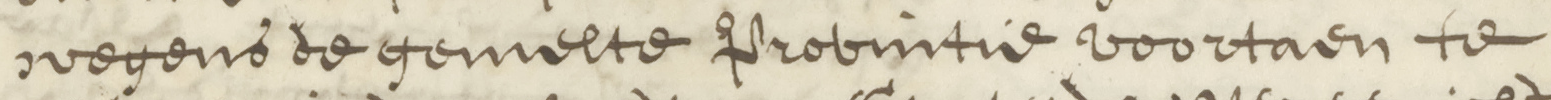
wegens de gemelte Provintie voortaen te
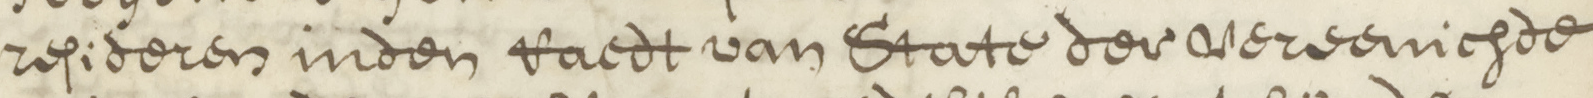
resideren inden Raedt van State der Vereenichde
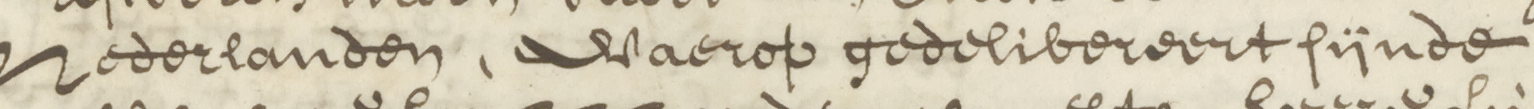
Nederlanden. Waerop gedelibereert sijnde
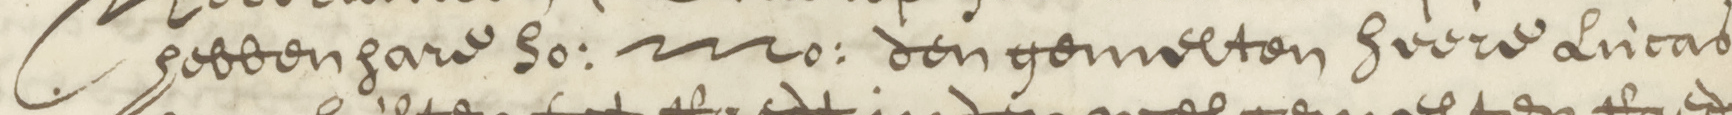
hebben hare ho:Mo: den gemelten heere Lucas
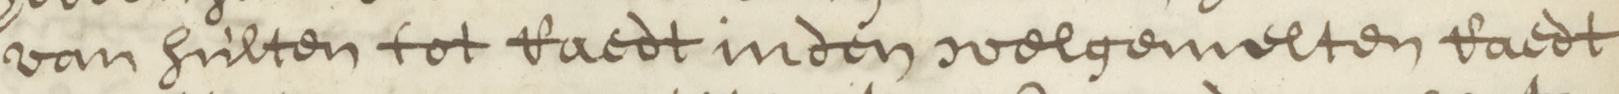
van hulten tot Raedt inden welgemelten Raedt
